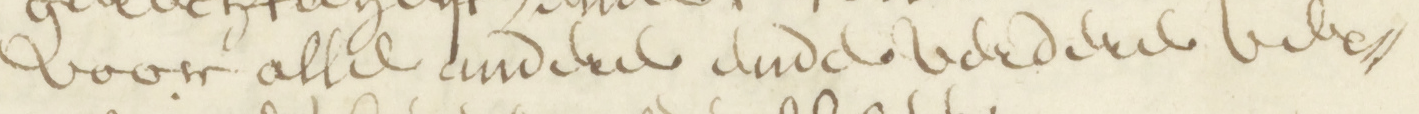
voor alle andere ende verdere ver„
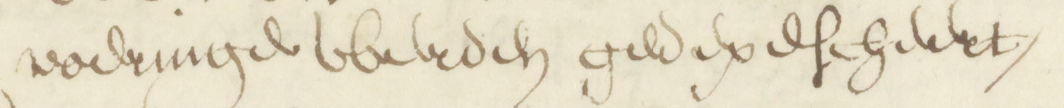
voeringe werden gedepescheert.
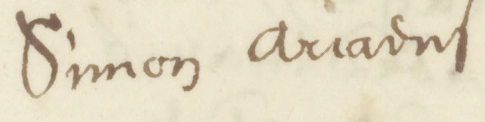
Simon Ariaens
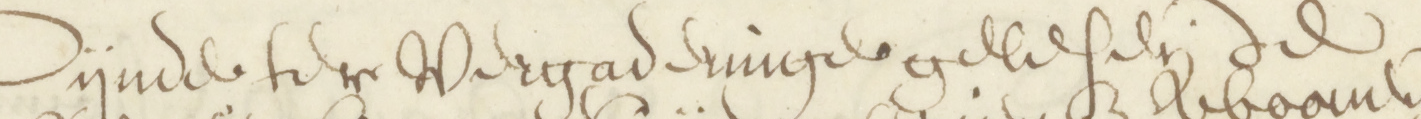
Sijnde ter vergaderinge gelesen de
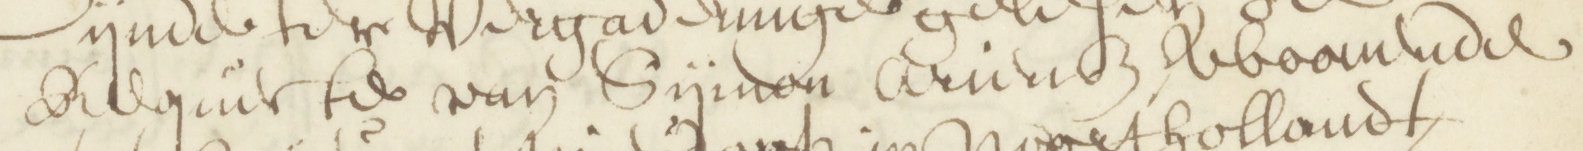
Requeste van Sijmon Ariens, woonende
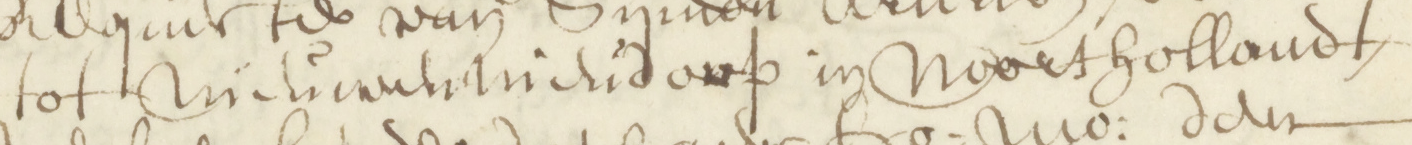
tot nieuwen nieudorp in Noorthollandt,
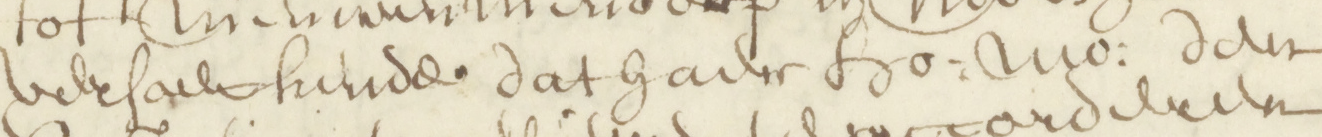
versoeckende dat haer Ho:Mo: den
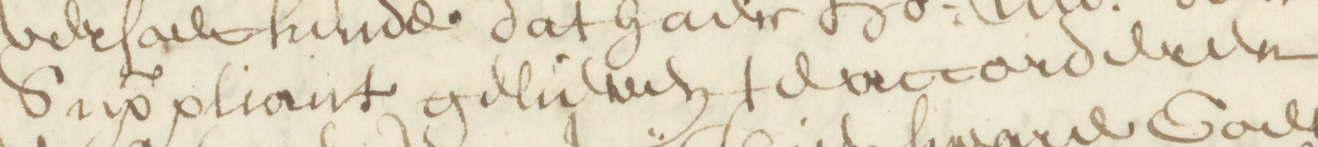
Suppliant gelieven te accorderen
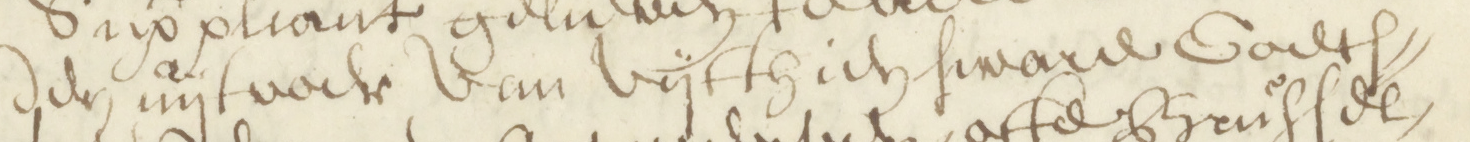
der uijtvoer van vijfthien sware Coets,,
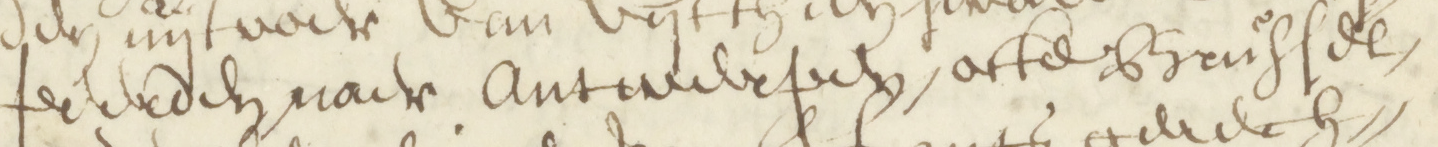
peerden naer Antwerpen, ofte Brussel,
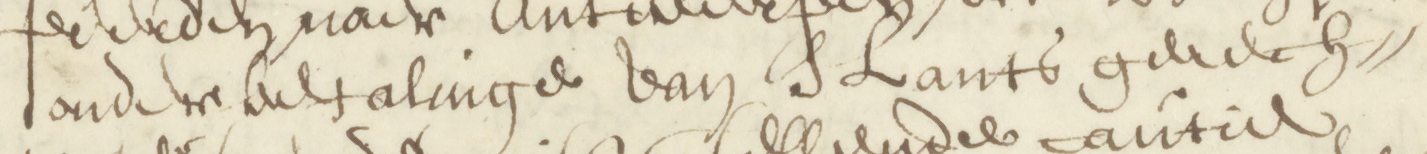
onder betalinge van ‛s Lants gerech,,
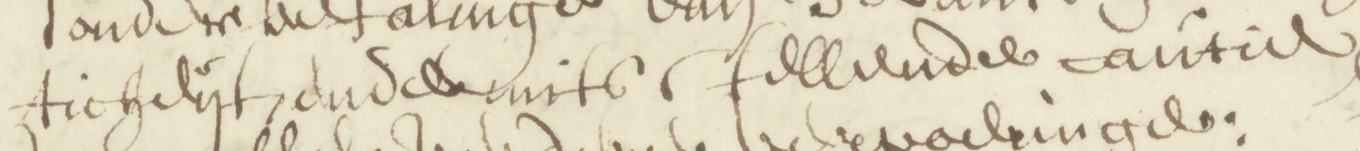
ticheijt, ende mits stellende cantie
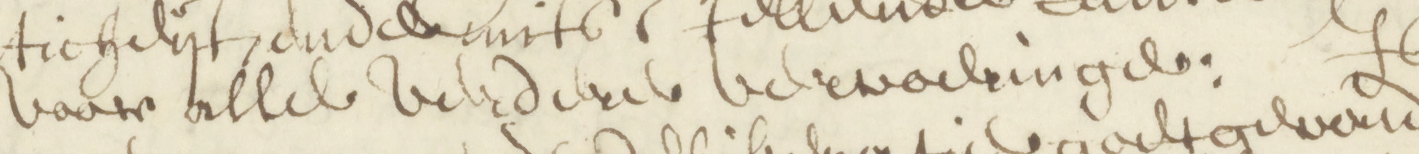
voor alle verdere vervoeringe: Is
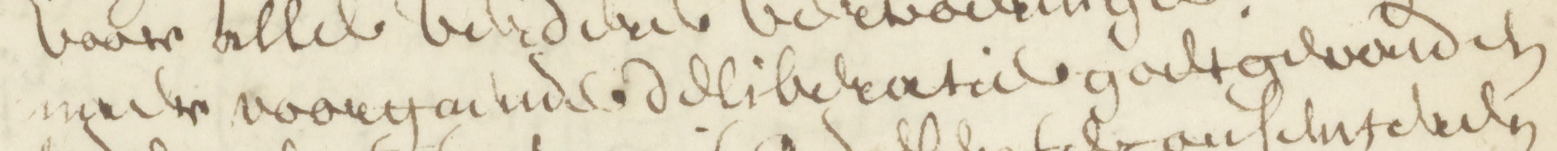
naer voorgaende deliberatie goetgevonden
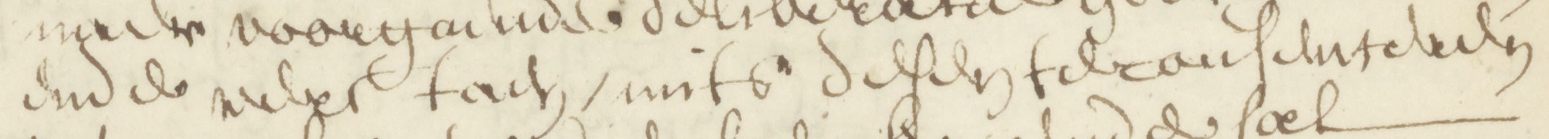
ende verstaen, mits desen te consenteren
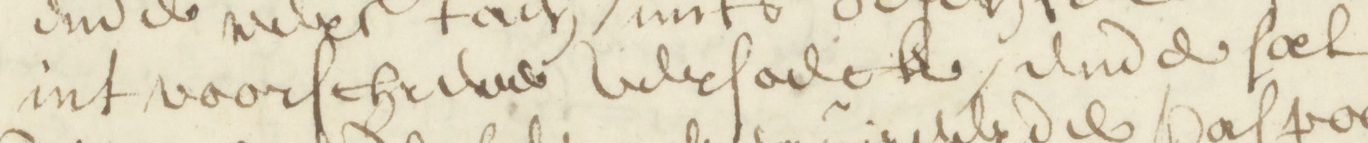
int voorschreve versoeck, ende sal
